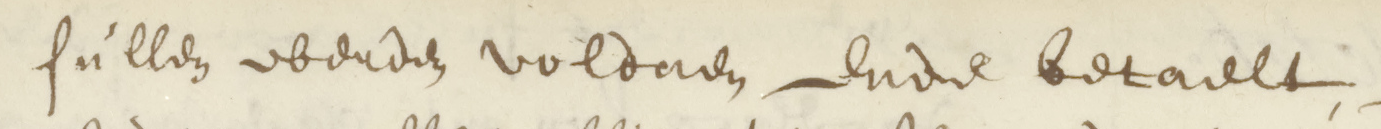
sullen werden voldaen ende betaelt
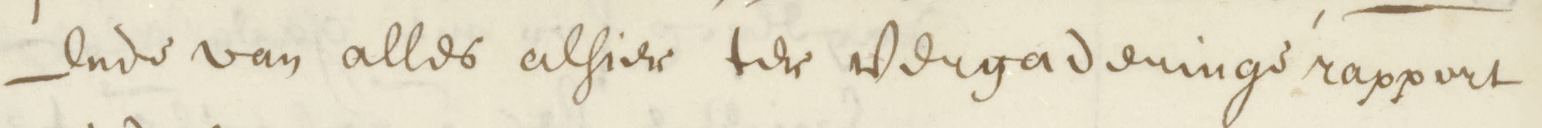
ende van alles alhier ter vergaderinge rapport
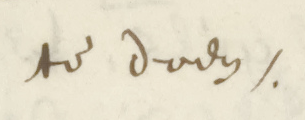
te doen.
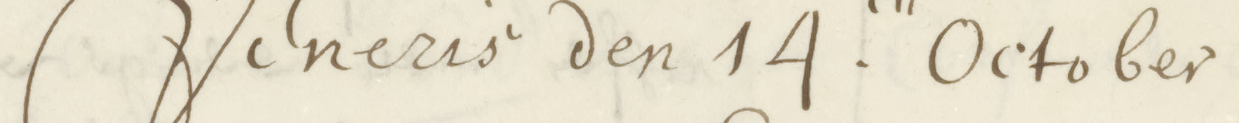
Veneris den 14en. October
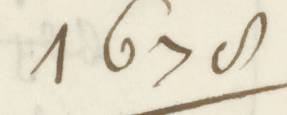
1678
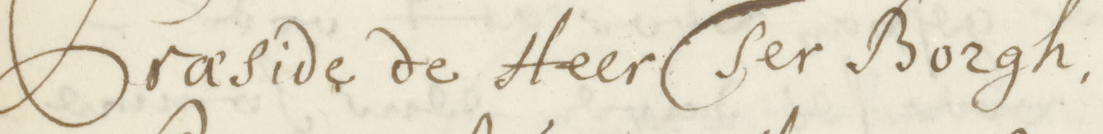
Præside de Heer Ter Borgh,
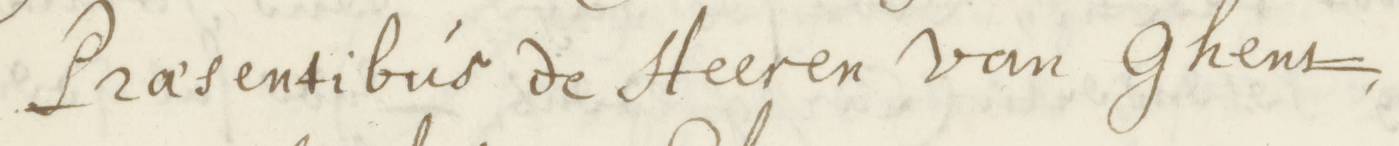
Præsentibus de Heeren van Ghent,
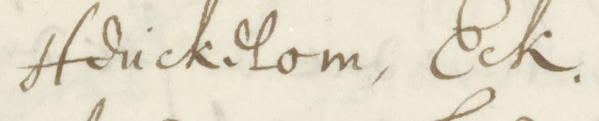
Heuckelom, Eck
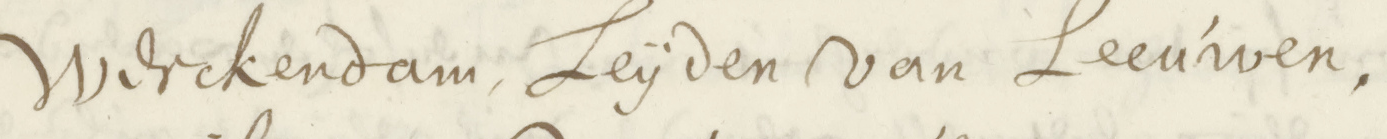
Werckendam, Leijden van Leeuwen,
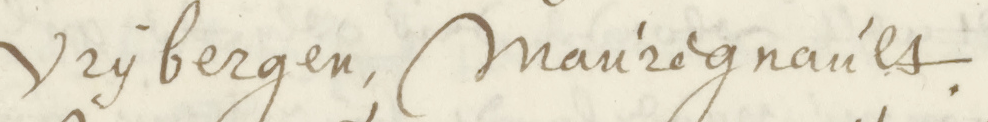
Vrijbergen, Mauregnault
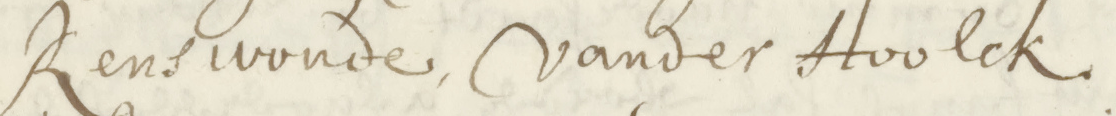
Renswoude, Vander Hoolck,
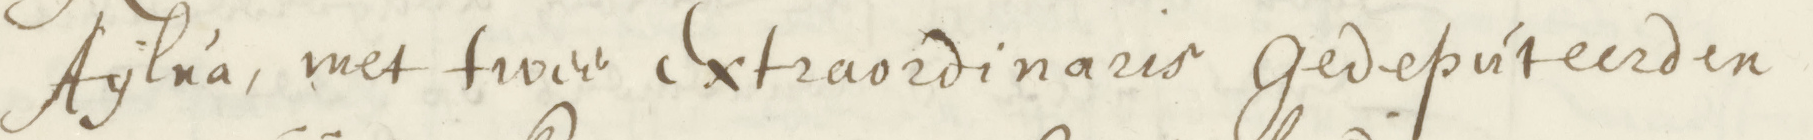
Aylua, met twee Extraordinaris Gedeputeerden
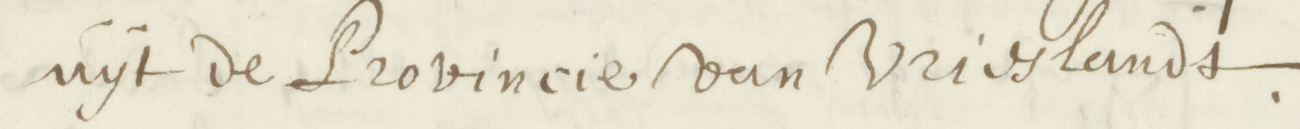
uijt de Provincie van Vrieslandt
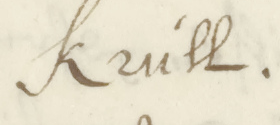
Krull.
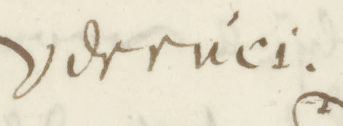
Verruci.
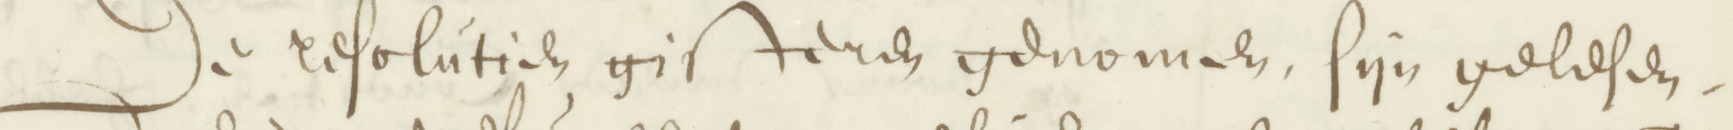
De resolutien gisteren genomen, sijn gelesen
